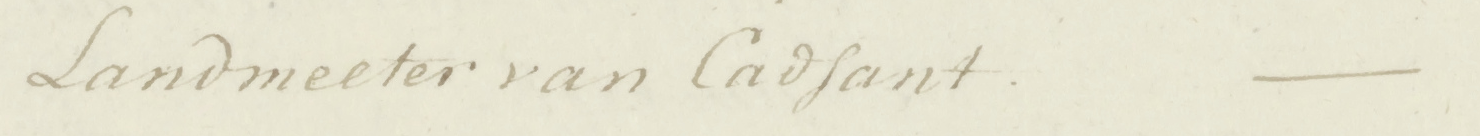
Landmeeter van Cadsant. —
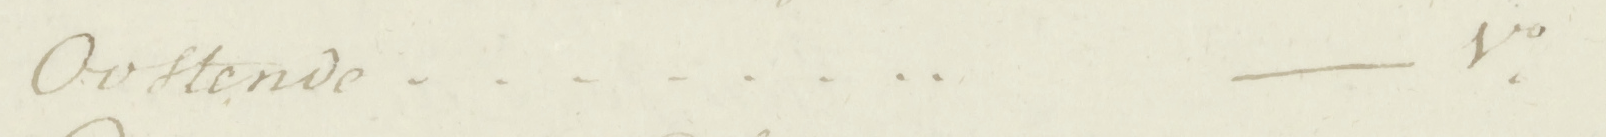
Oostende........ — Vo.
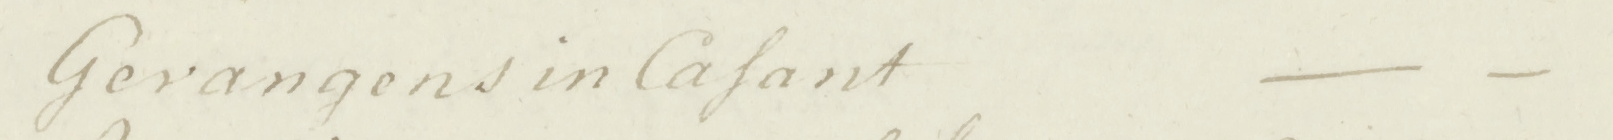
Gevangens in Casant. —
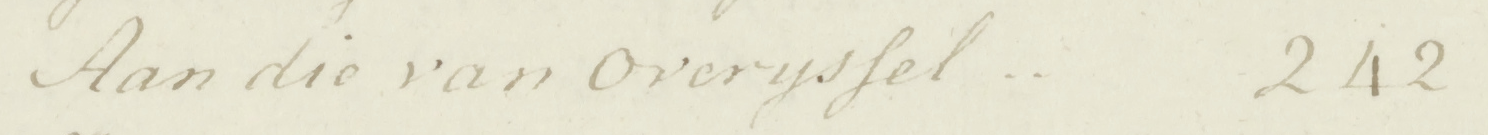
Aan die van Overyssel.. 242.
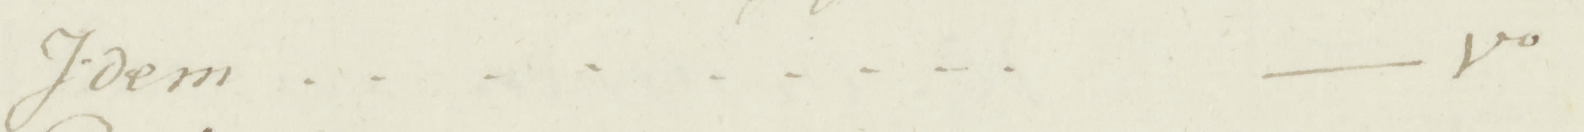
Idem......... — Vo.
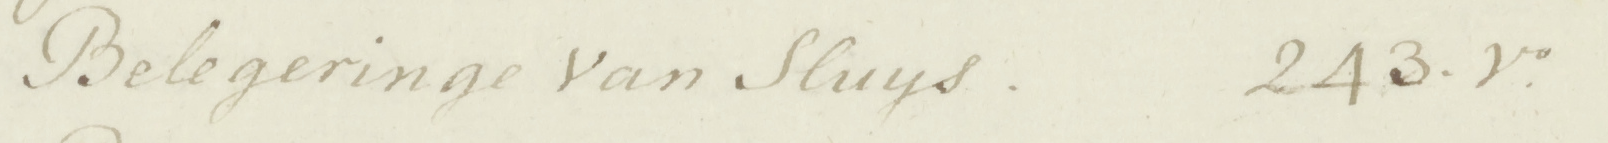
Belegeringe van Sluys. 243.Vo.
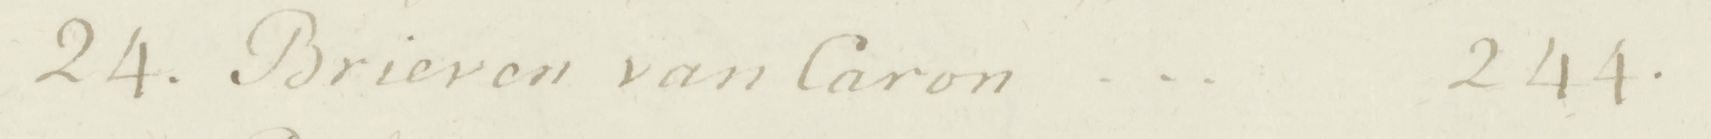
24. Brieven van Caron... 244.
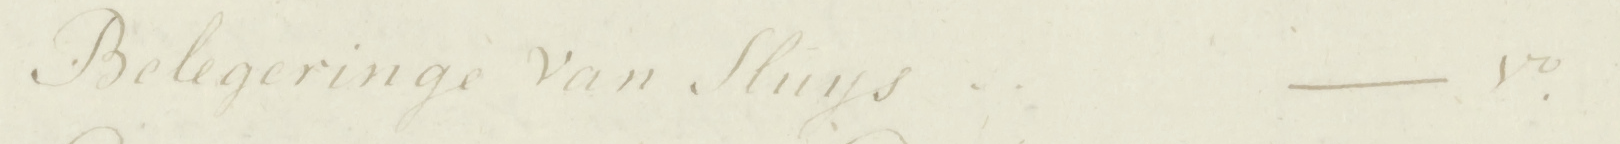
Belegeringe van Sluys .. — Vo.
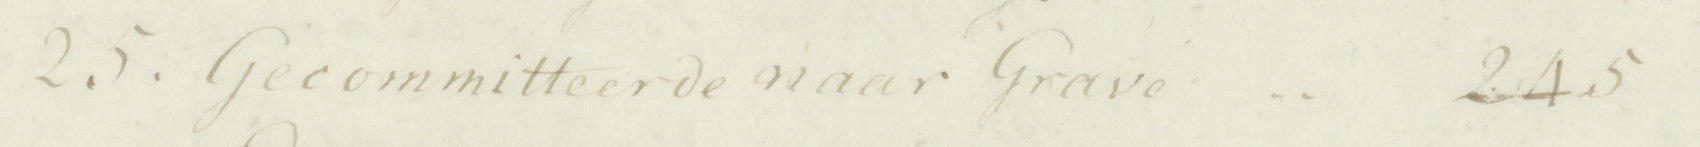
25. Gecommitteerde naar Grave.. 245
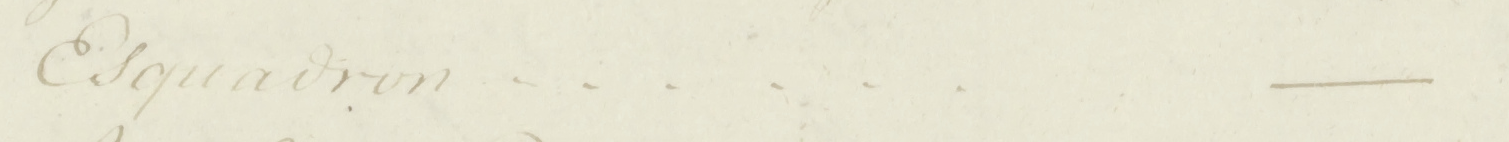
Esquadron...... —
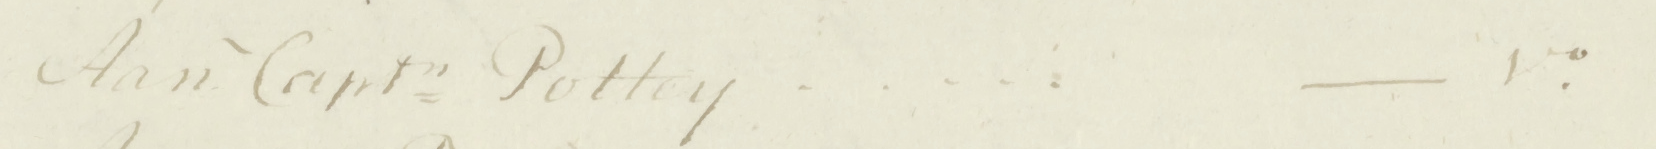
Aan Captn Pottey.....— Vo.
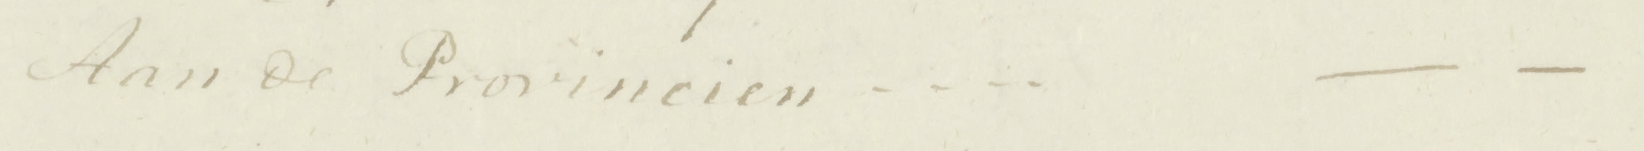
Aan de Provincien....— -
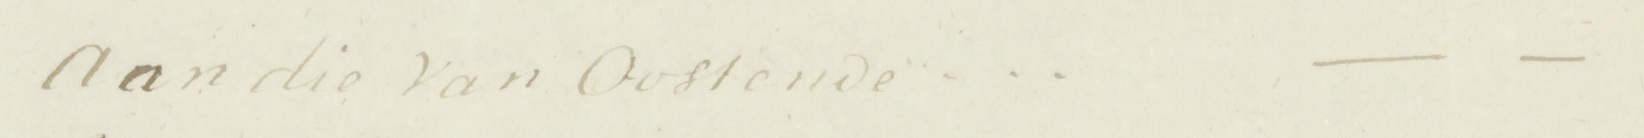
Aan die van Oostende...— -
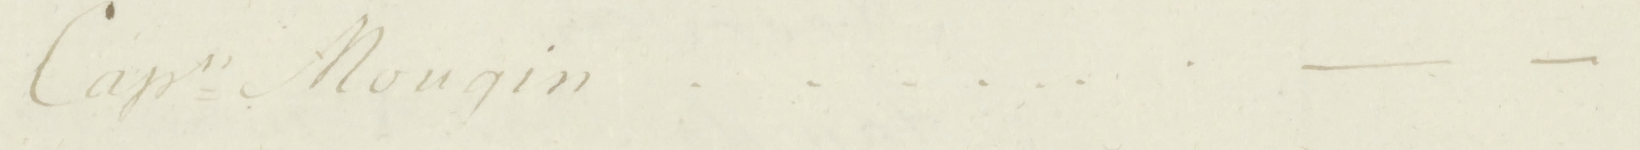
Capn Mougin........— -
